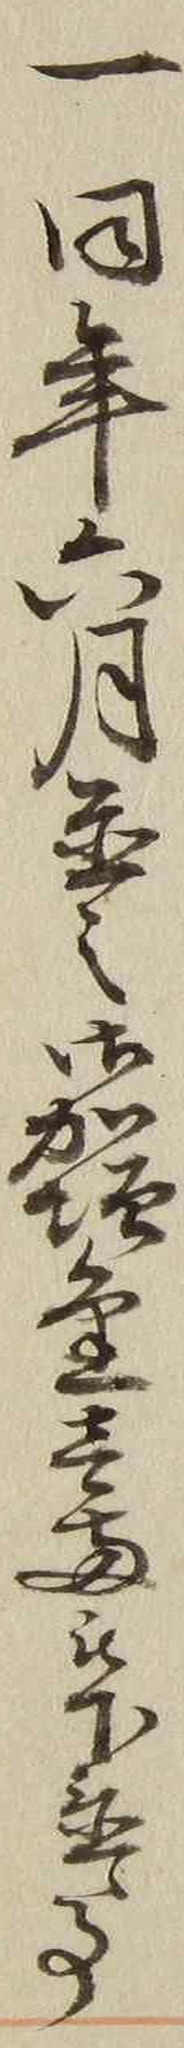一同年六月並之御加増金壱両被下置候事
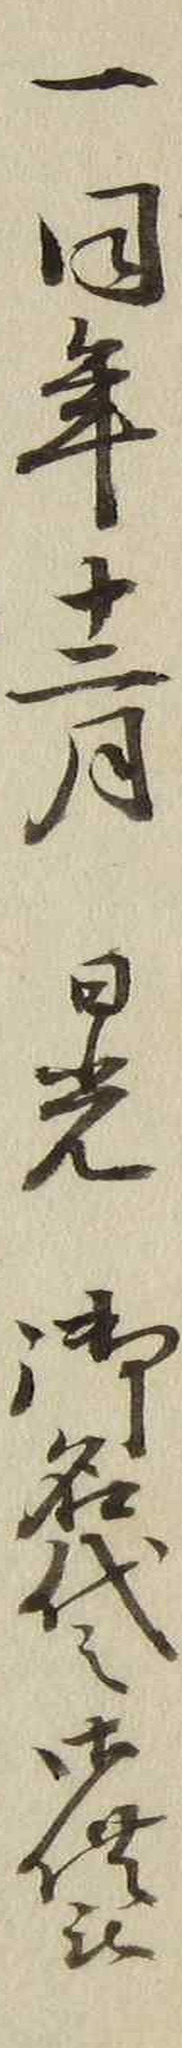一同年十二月日光御名代之御供被
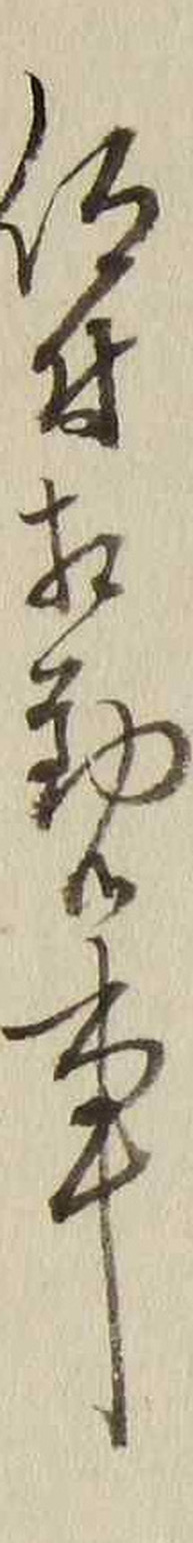仰付相勤候事
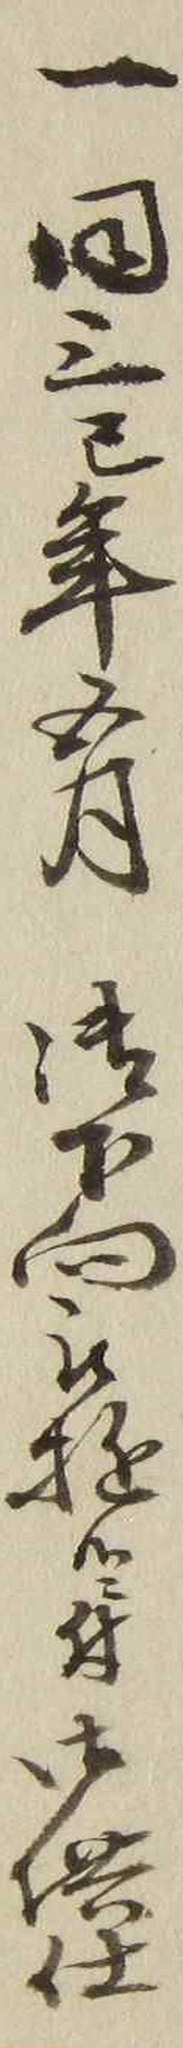一同三巳年五月御下向被遊候ニ付御供仕
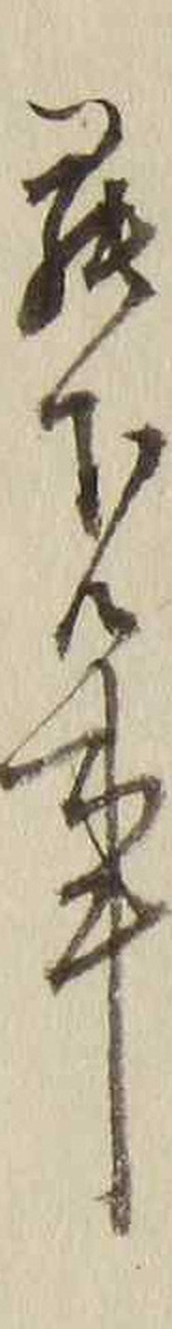罷下候事

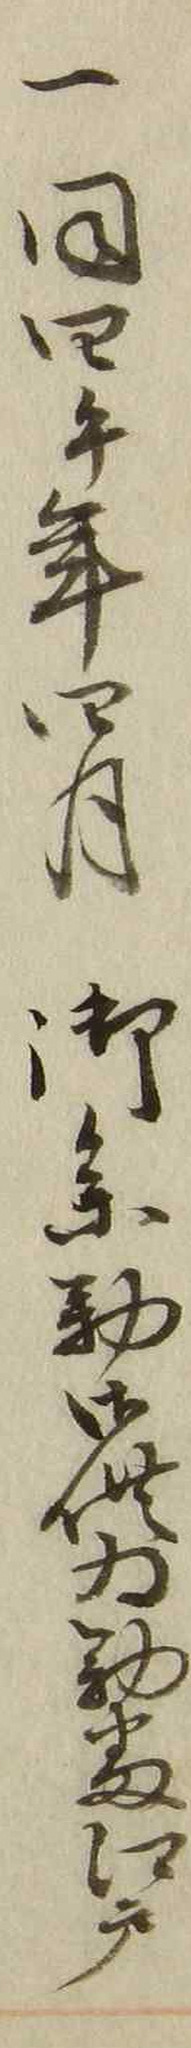一同四午年四月御参勤御供為勤番江戸
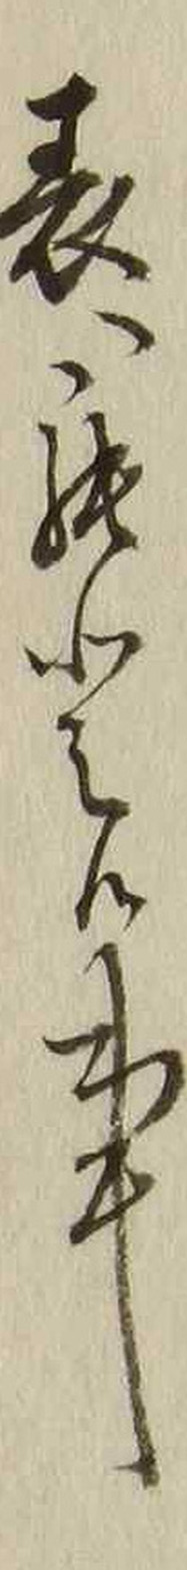表へ罷登候事
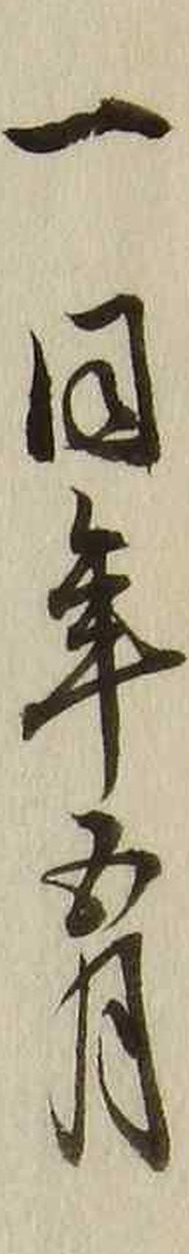一同年五月
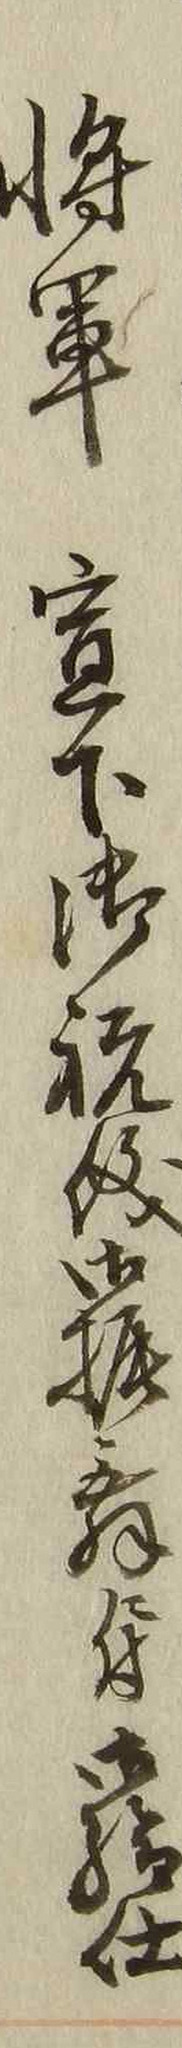将軍宣下御祝儀御振舞ニ付御給仕
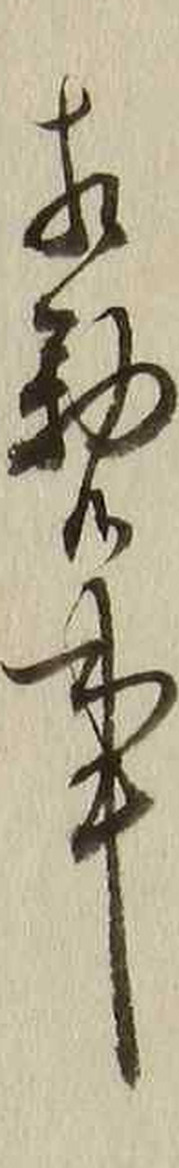相勤候事
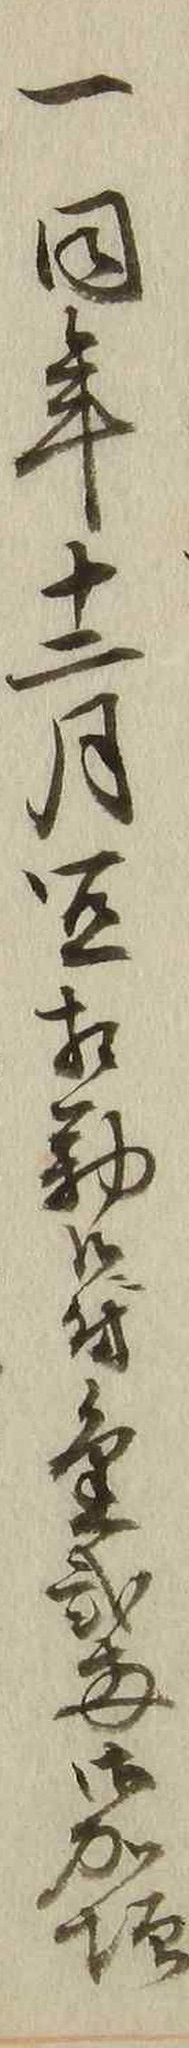一同年十二月宜相勤候ニ付金弐両御加増
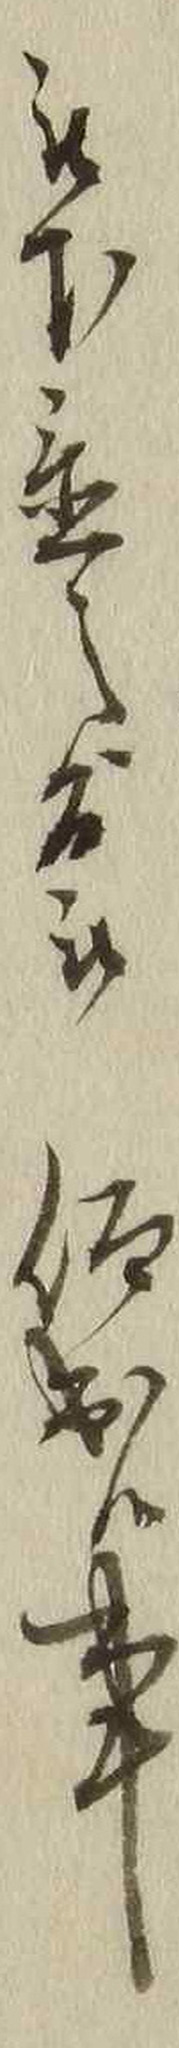被下置之旨被仰出候事
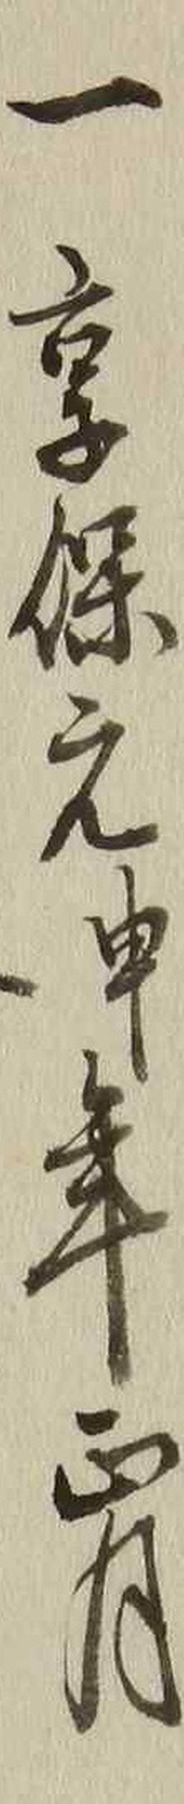一享保元申年正月
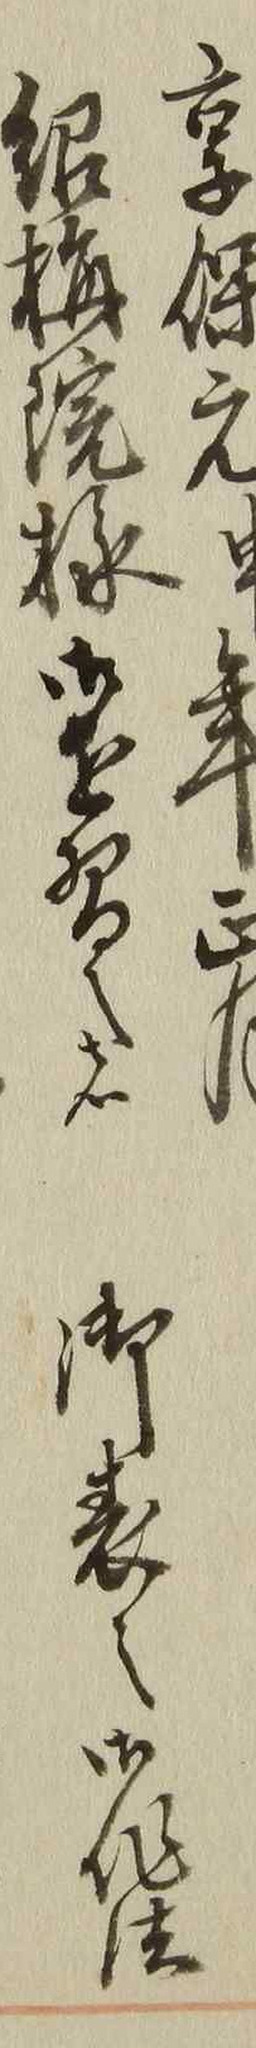紹栴院様御近習之者御表之御作法
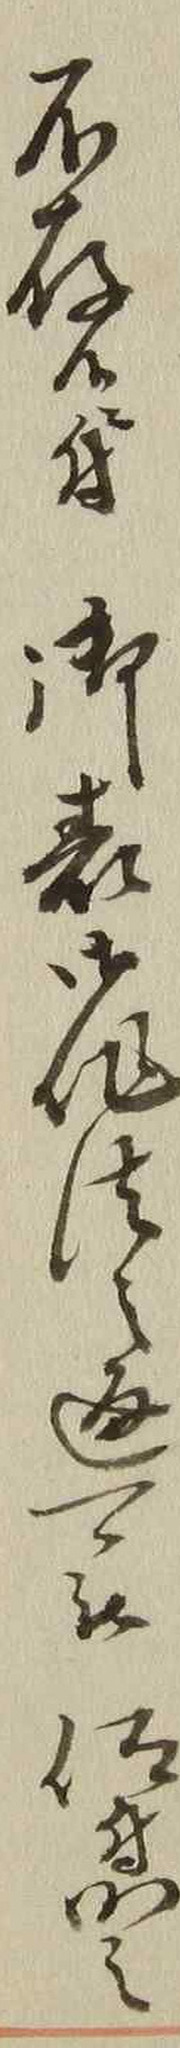不存候ニ付御表御作法之通可被仰付仍之
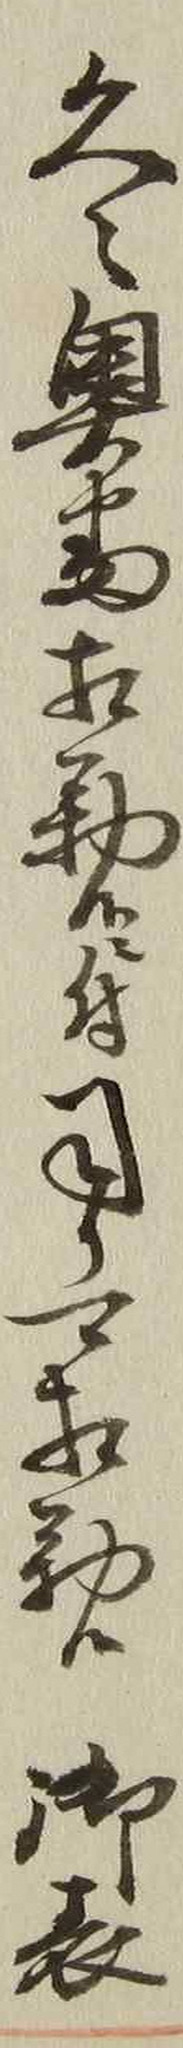久々奥番相勤候ニ付司り可相勤候御表
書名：諸士系譜　巻之23　い之部23
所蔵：会津若松市立会津図書館
